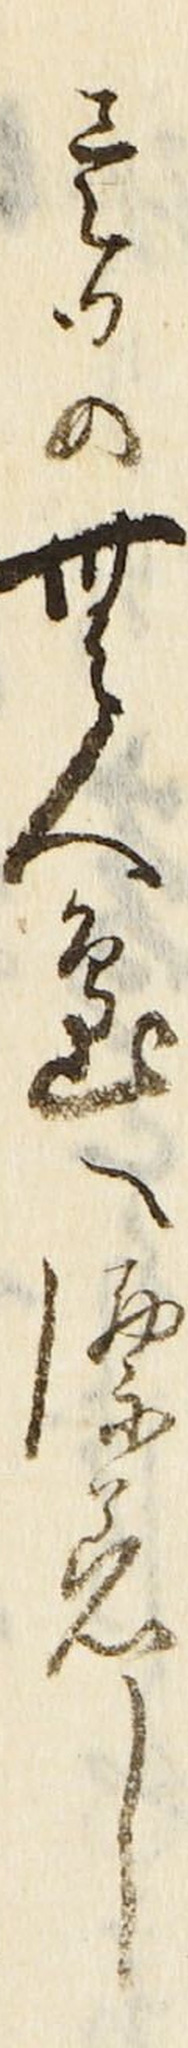壱ツの無人島へ漂着し
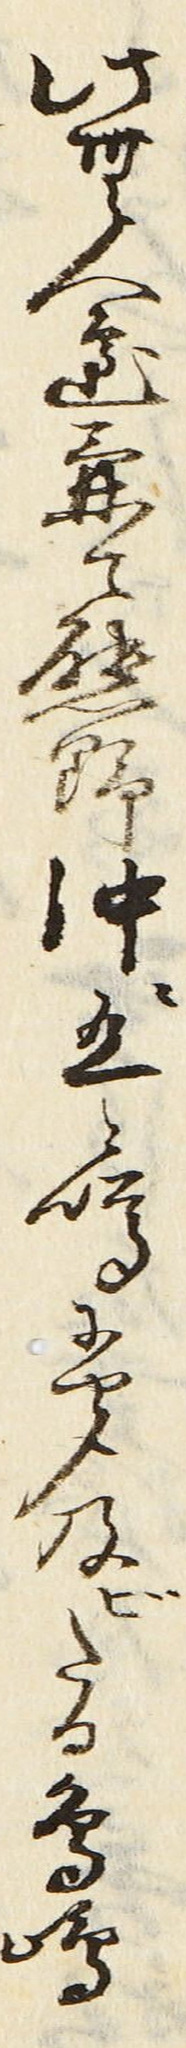此無人島兼て熊野沖ニ有候島に聞及ビたる鳥島
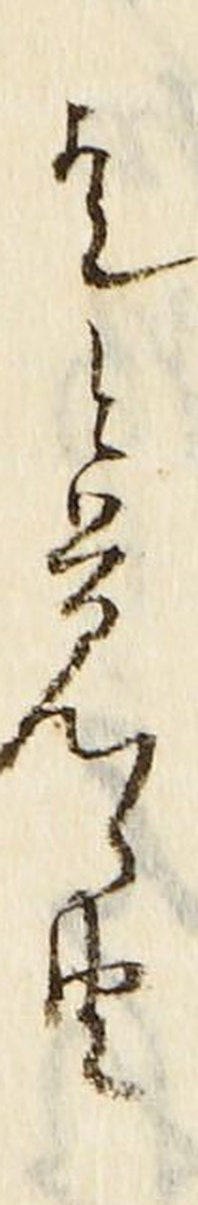歟と覚候由
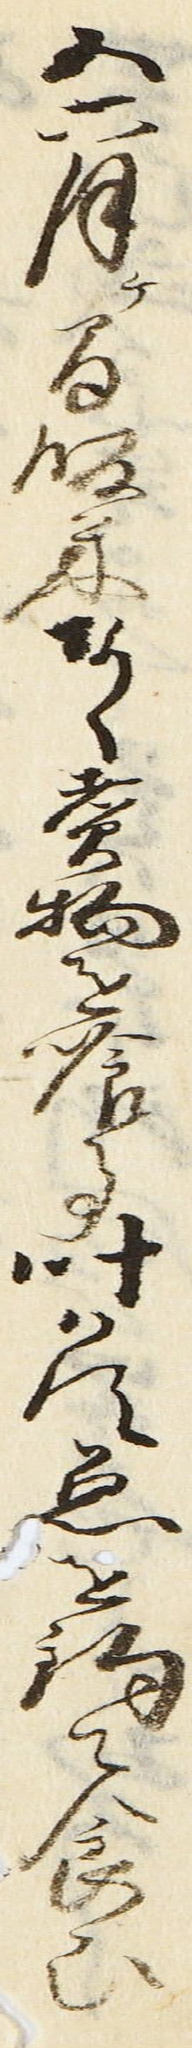又六月ケ間飯米なく煮物を喰事叶ハす魚を釣て食ひ
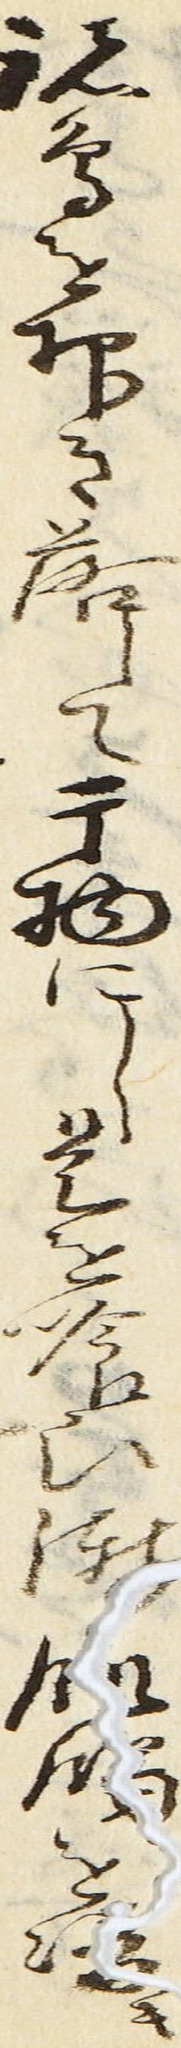諸鳥を叩き落して干物にし是を喰ひ漸飢渇を凌キ
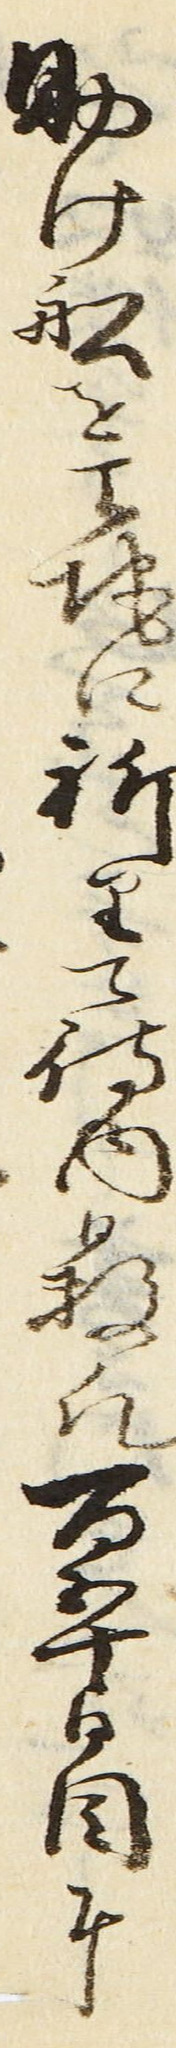助け船を天地に祈りて待内日数凡百五十日目に
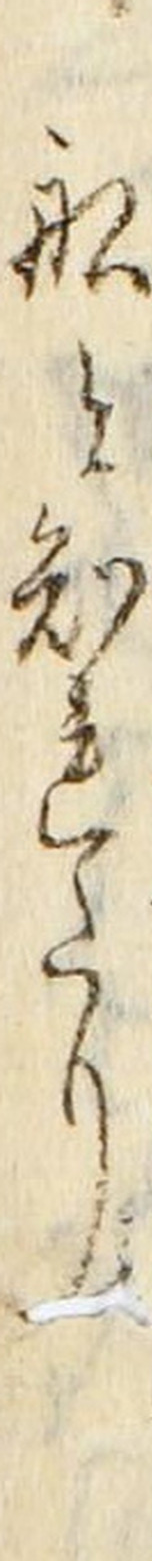船と知れたり

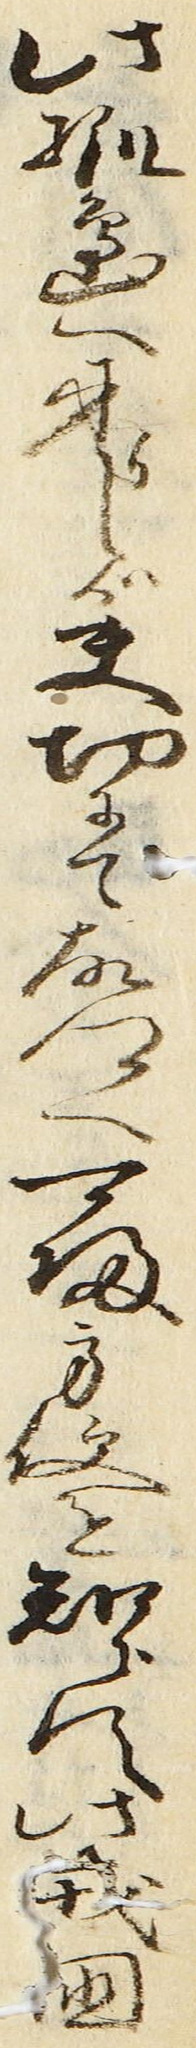此孤島へ来りしが夫切にて故郷へ可帰方便を知らす此戎国
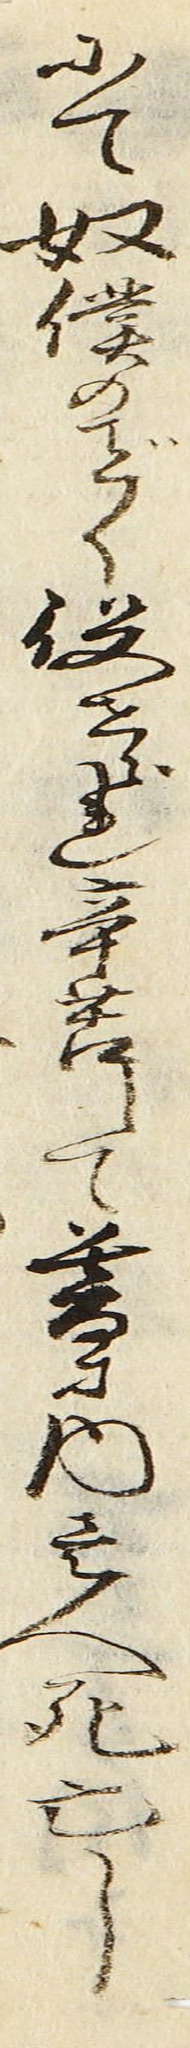にて奴僕のごとく役せられ辛苦して暮す内壱人死亡し
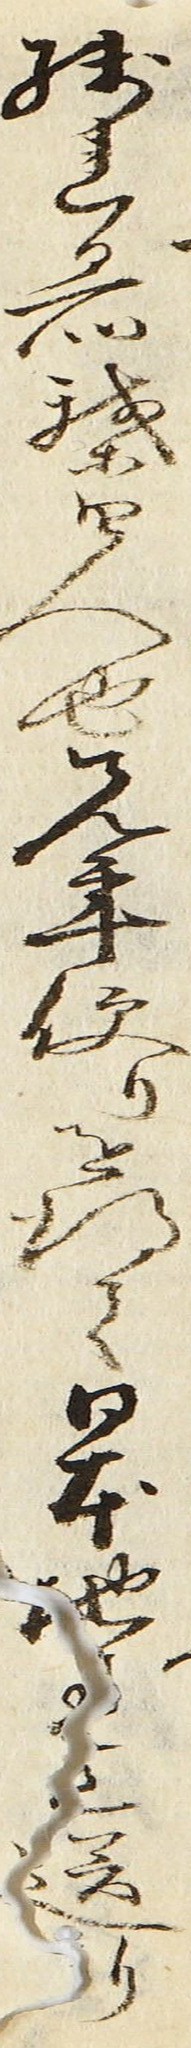残れる所我等四人也先年便りを得て日本地方迄送り
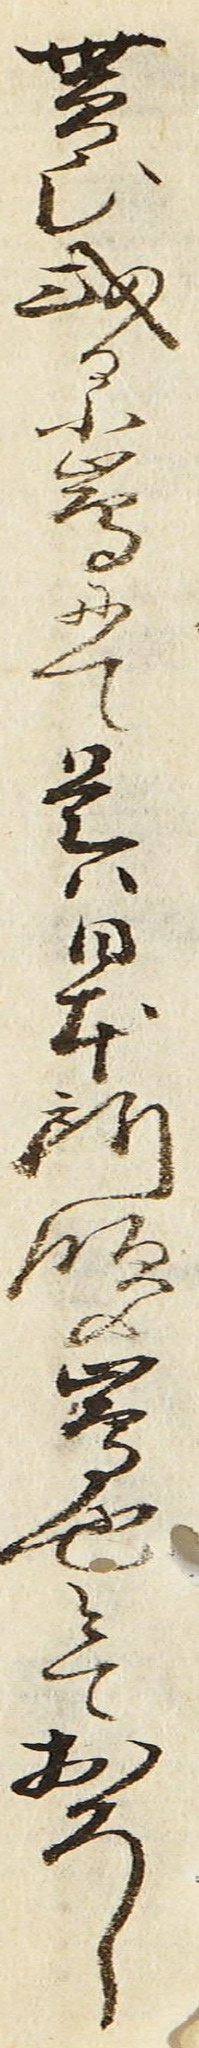貰ひ或る小島にて是ハ日本所領の島也とておろし
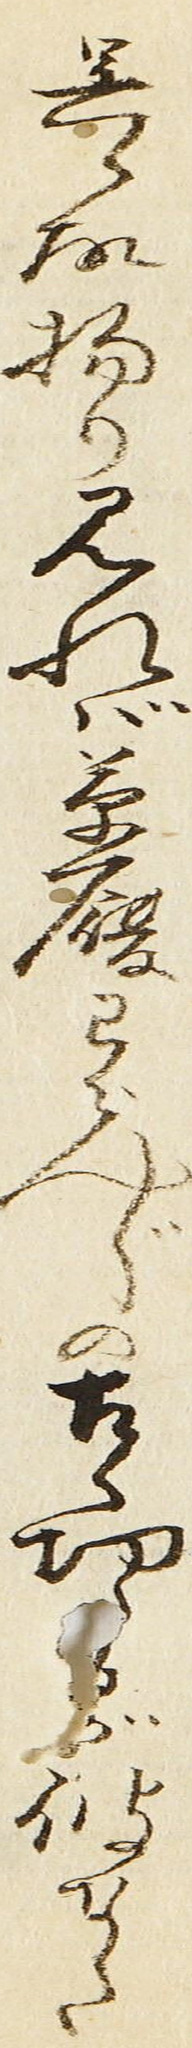呉候故揚り見れバ草履わらんじの古く切たるが彼なた
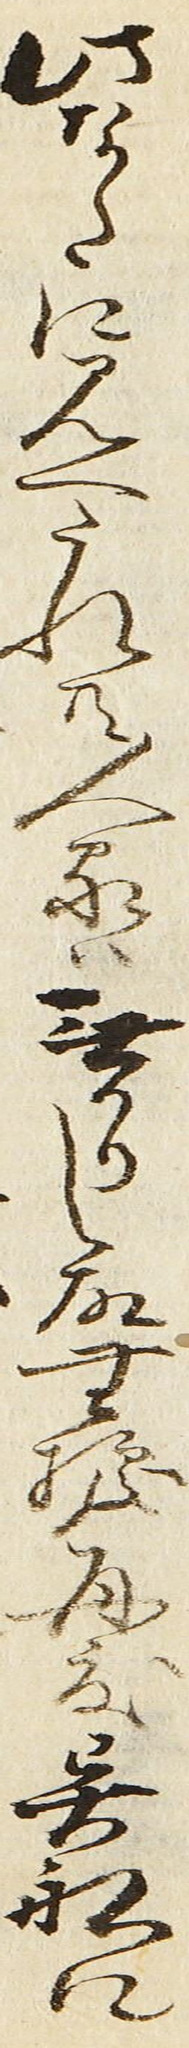此なたに見へたれ共人家ハ無かりし故無拠再度異船に
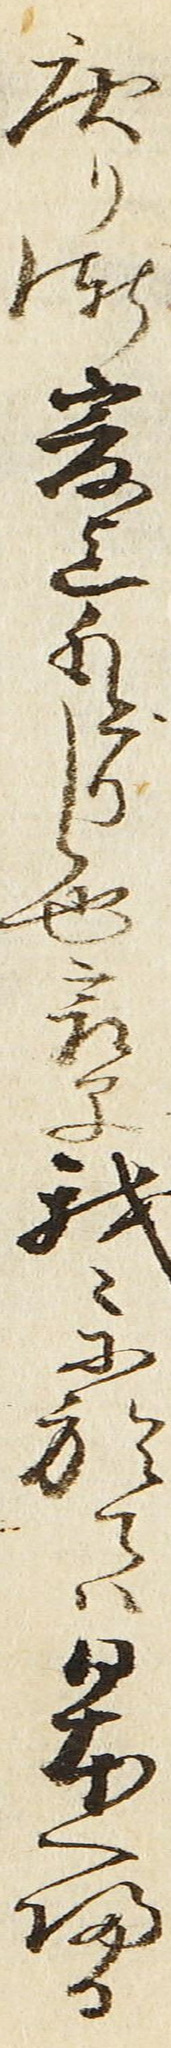戻り漸爰迄もどりし也最早我々に於てハ日本へ帰る
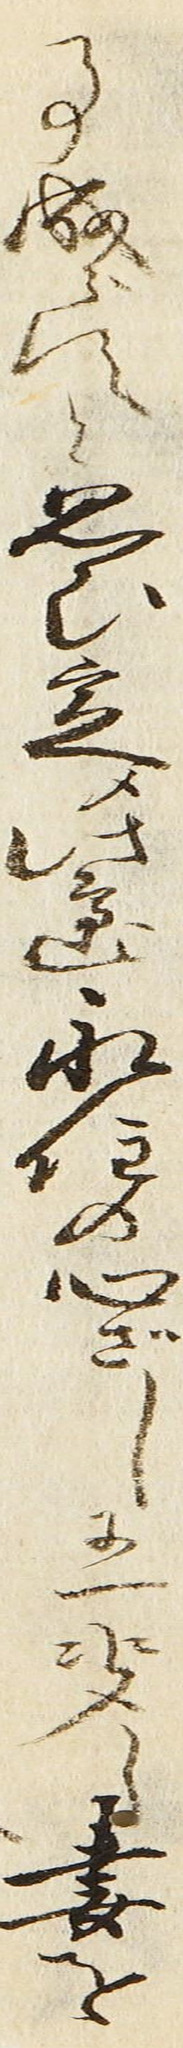事成らすと思ひ定メ此島永住の心ざしに一決し妻を
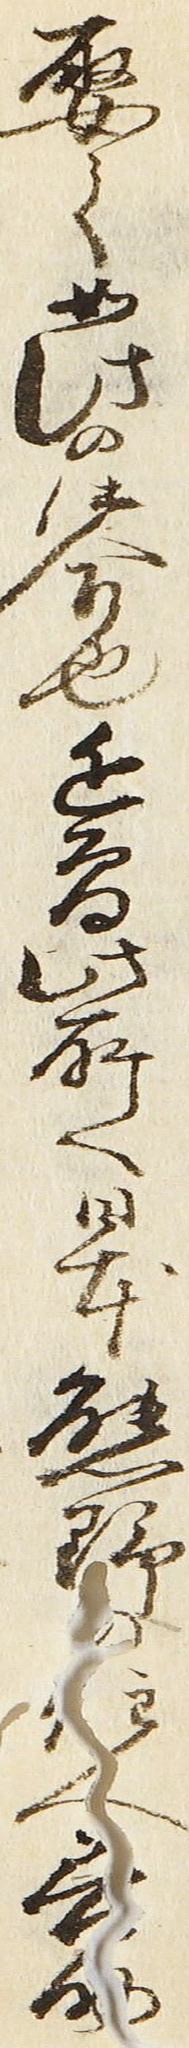娶て如此の仕合也近曽此所へ日本熊野の住人善助
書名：亜墨利加漂流記聞
